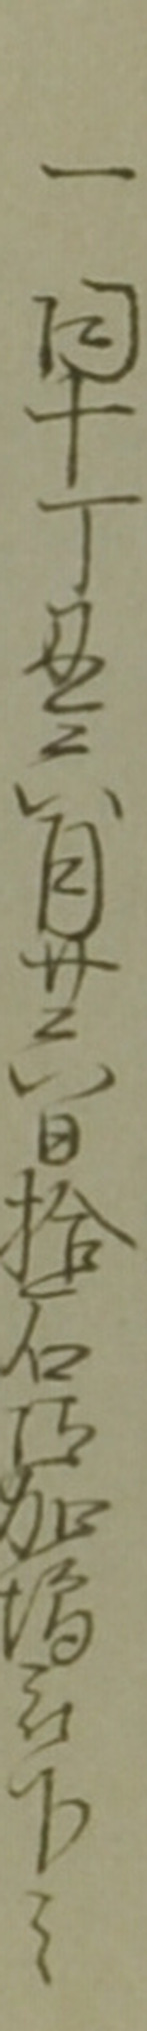一同十丁丑六月廿六日拾石御加増被下候
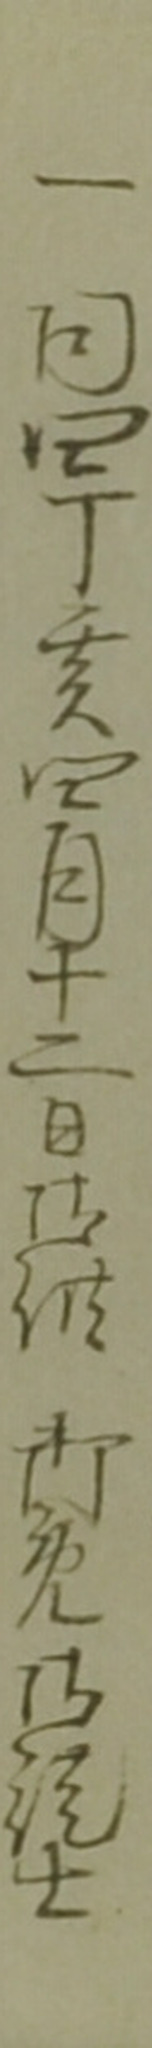一同四丁亥四月十二日御供御免御徒士
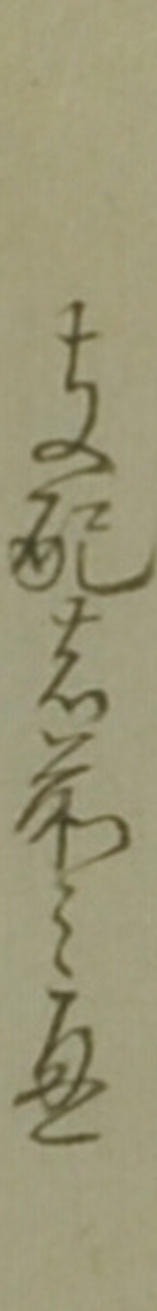支配者前之通
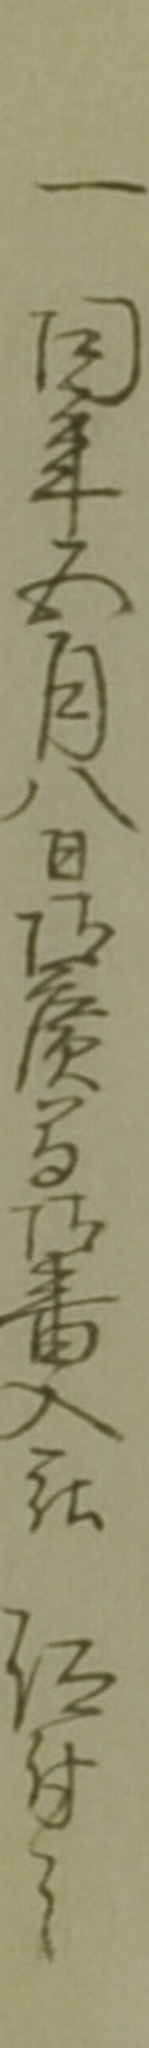一同年五月八日御広間御番入被仰付候
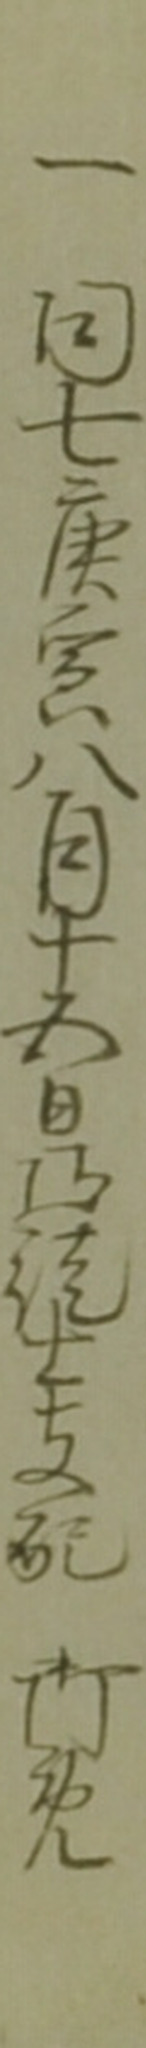一同七庚寅八月十五日御徒士支配御免
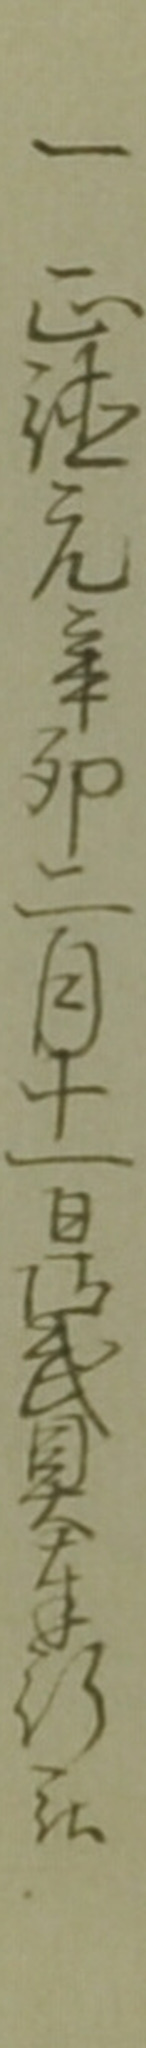一正徳元辛卯二月十一日御武具奉行被
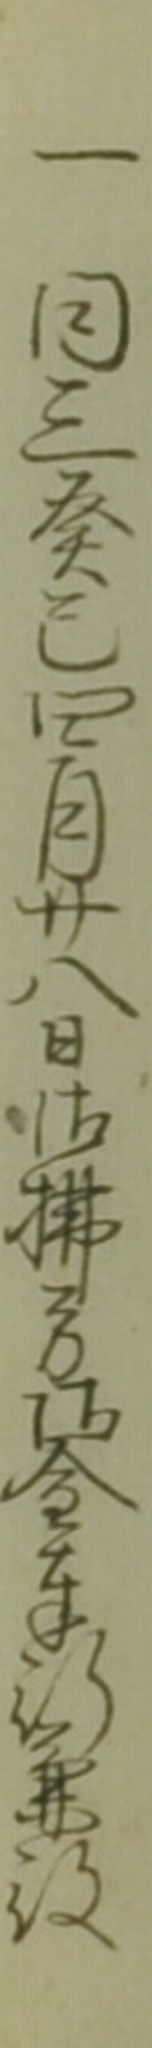一同三癸巳四月二十八日御払方御金奉行兼役
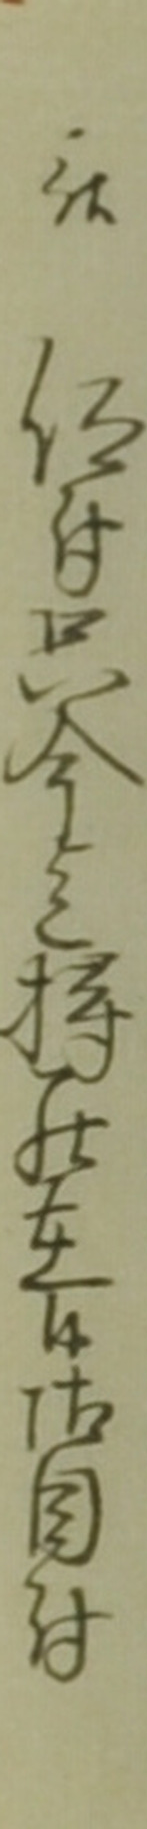被仰付只今迄持罷在候御目付

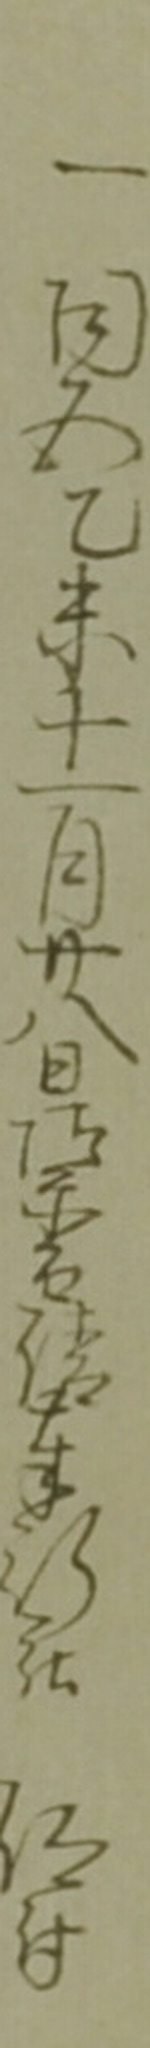一同五乙未十一月廿八日御普請奉行被仰付
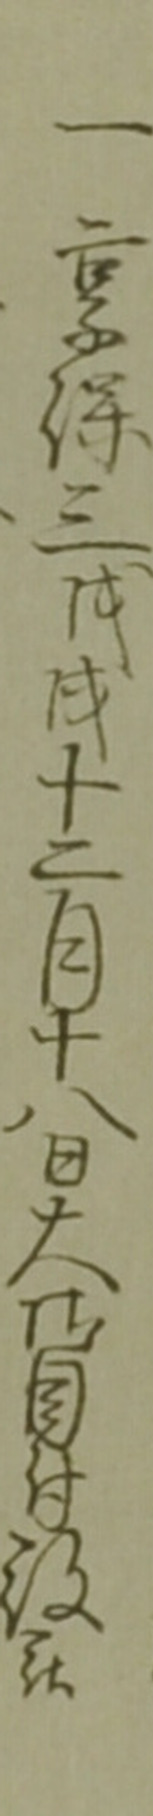一享保三戊戌十二月十八日大御目付役被
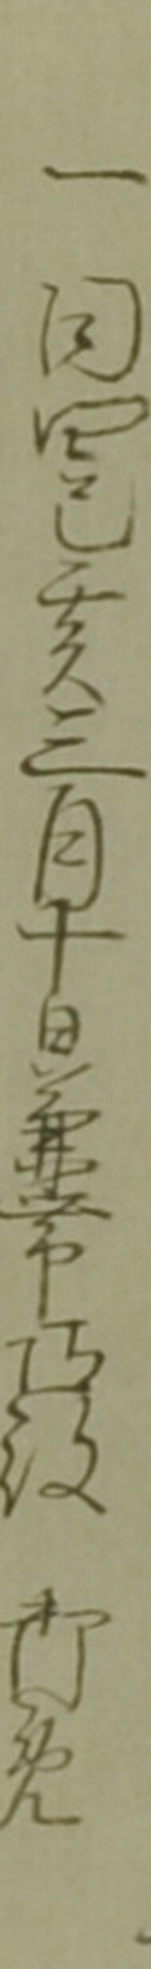一同四己亥三月十日兼帯御役御免
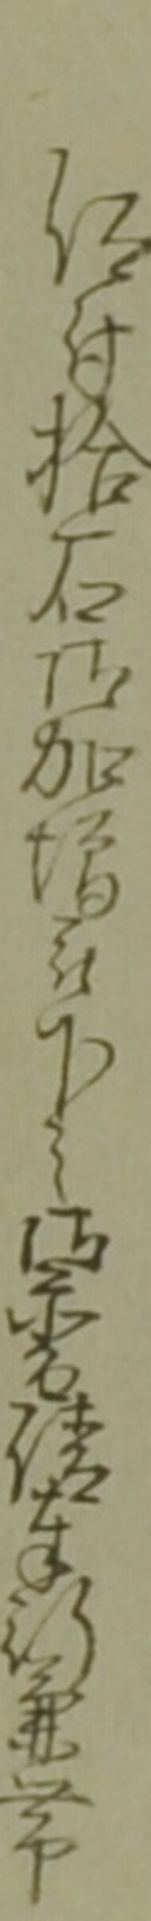仰付拾石御加増被下候御普請奉行兼帯
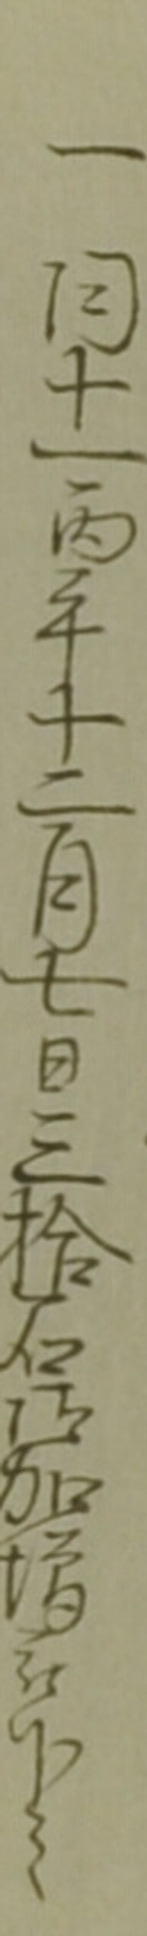一同十一丙午十二月七日三拾石御加増被下候
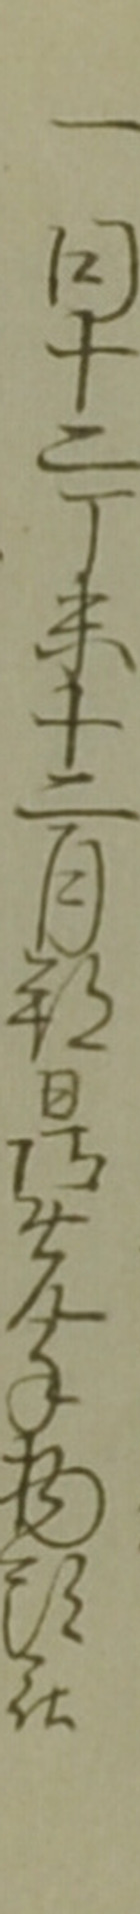一同十二丁未十二月朔日御先手物頭被
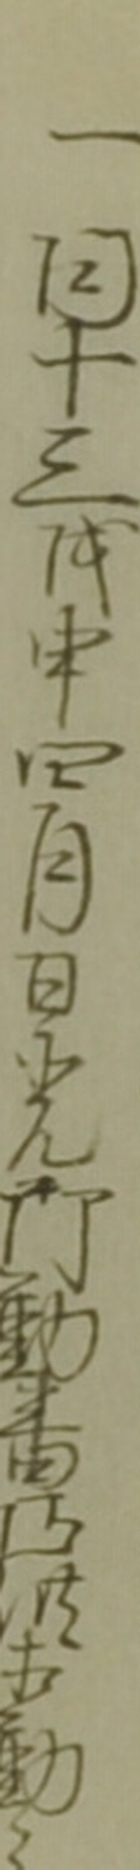一同十三戊申四月日光御勤番御供相勤候
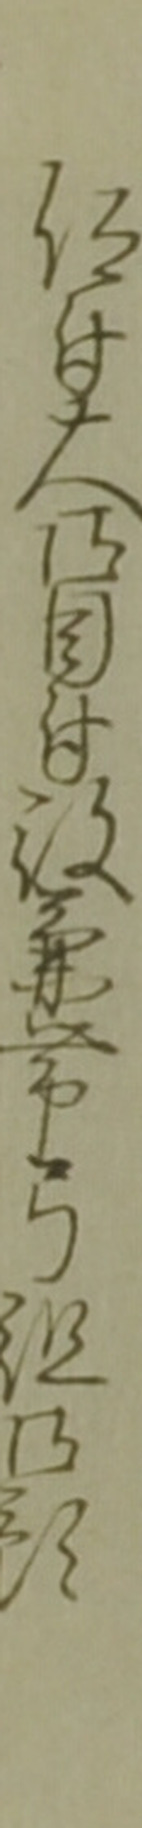仰付大御目付役兼帯弓組御預
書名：給人諸士勤仕録（三）
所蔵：伊那市立高遠町図書館・合同会社AMANE
